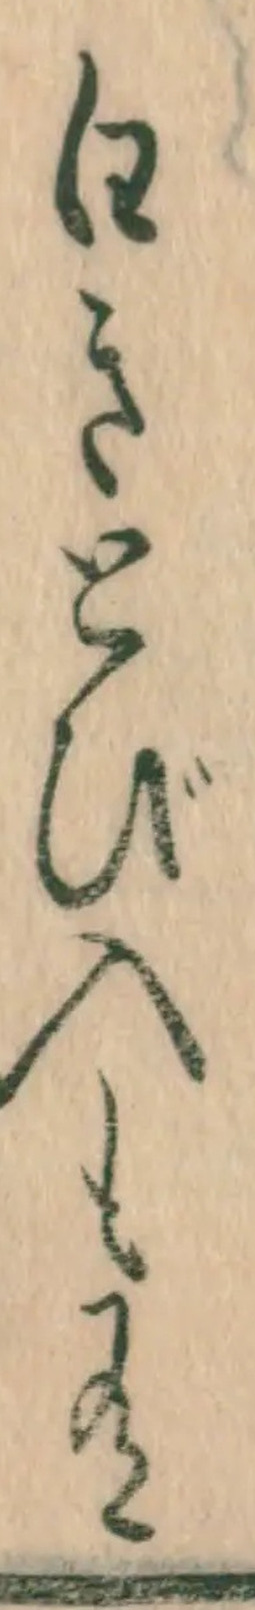白きとび入も有
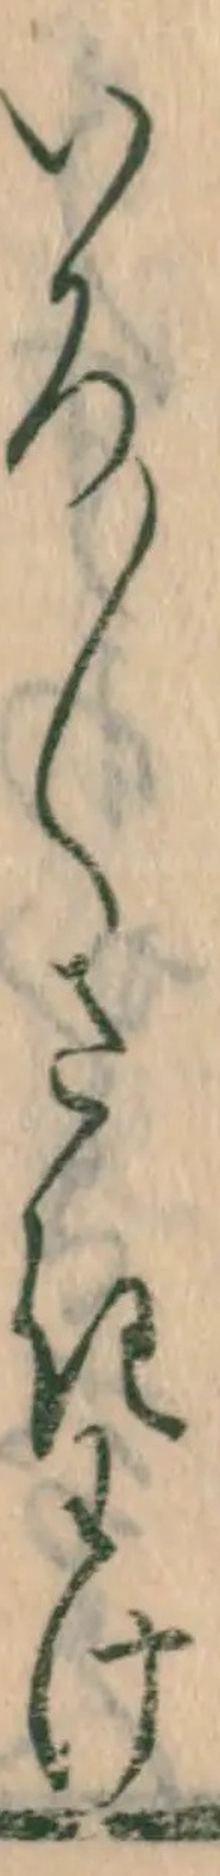いろ〳〵さきわけ
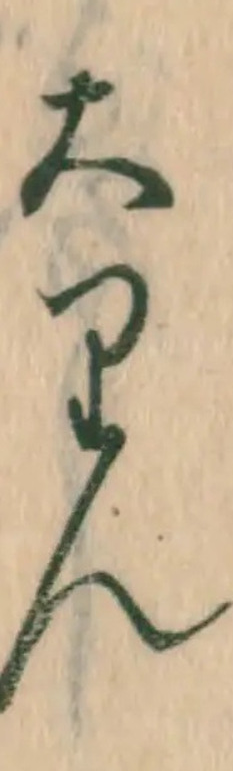大りん
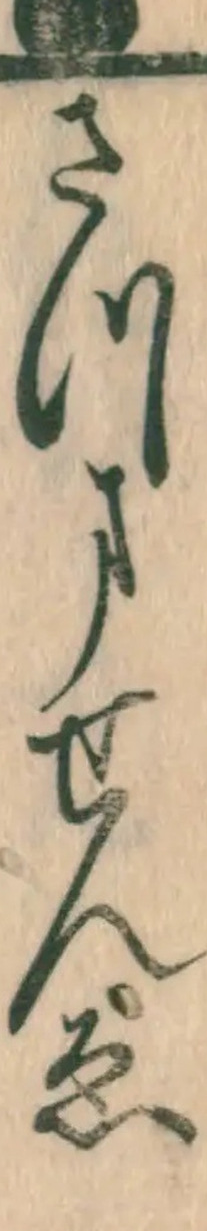●さつませんゑ
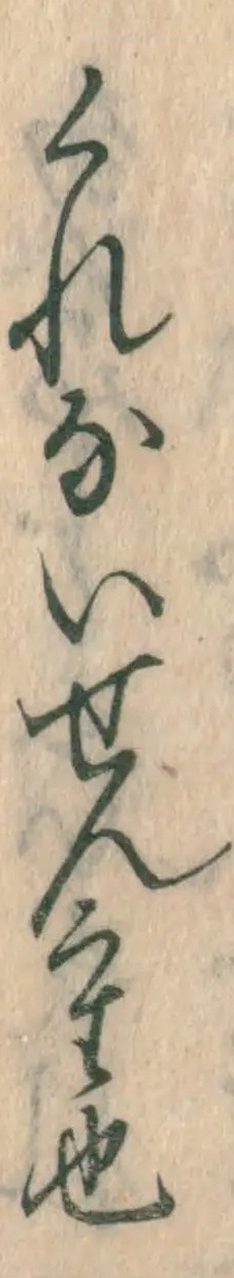くれないせん重也

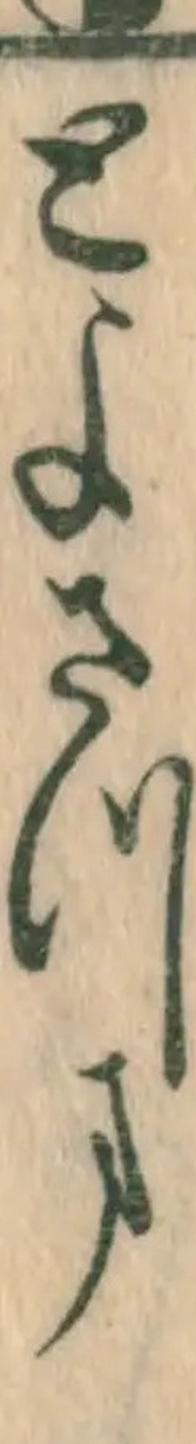とよさつま
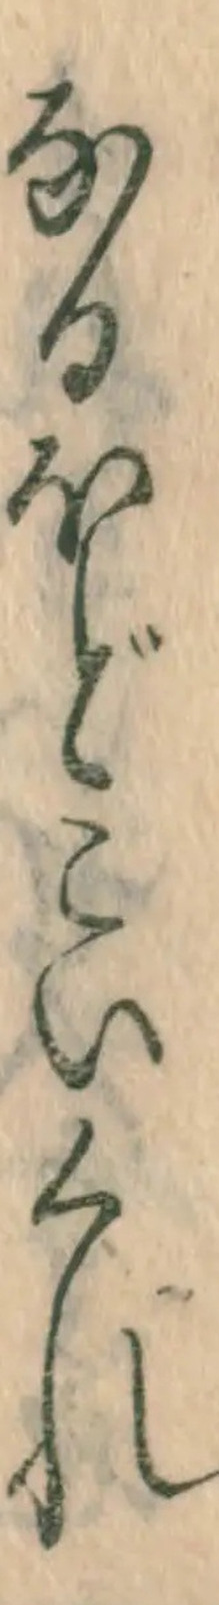なるほどこひくれ
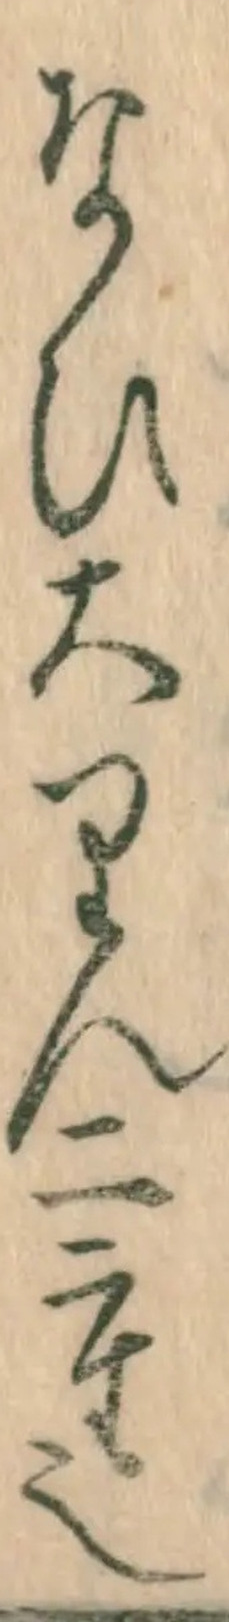なひ大りん二重也
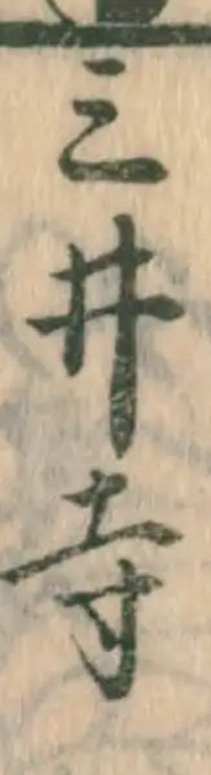三井寺
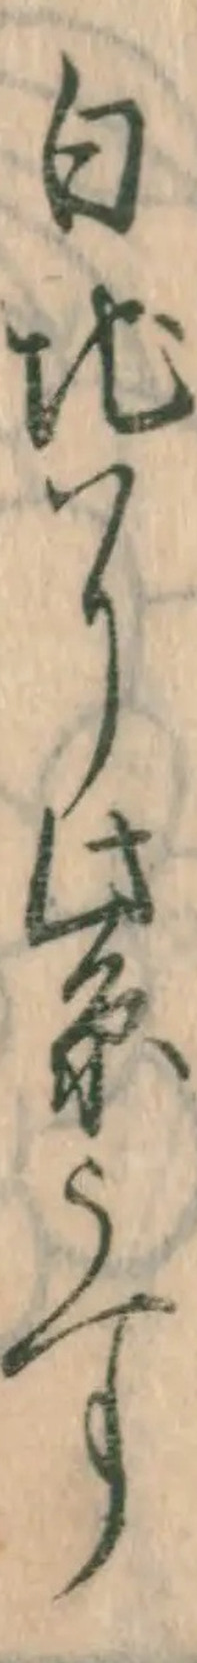白地に紫うす
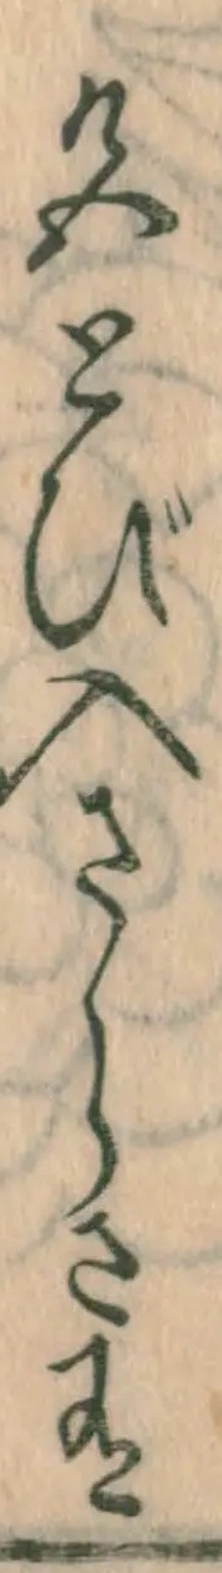色とび入さらさ有
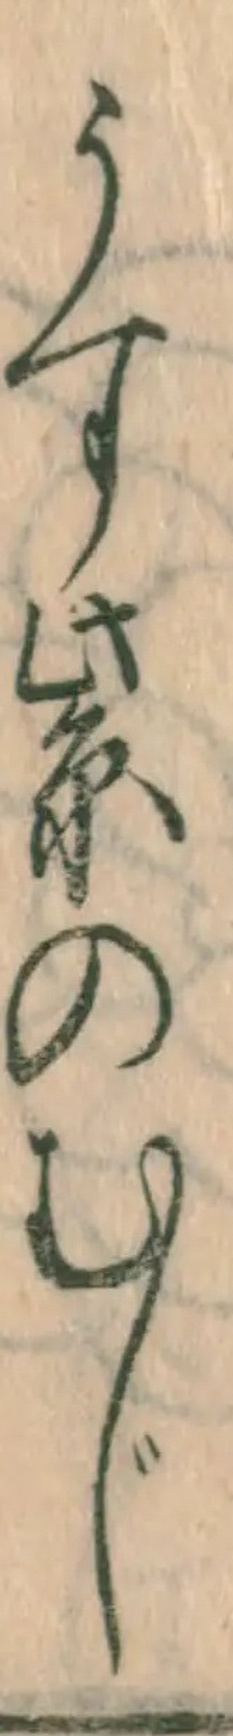うす紫のむじ
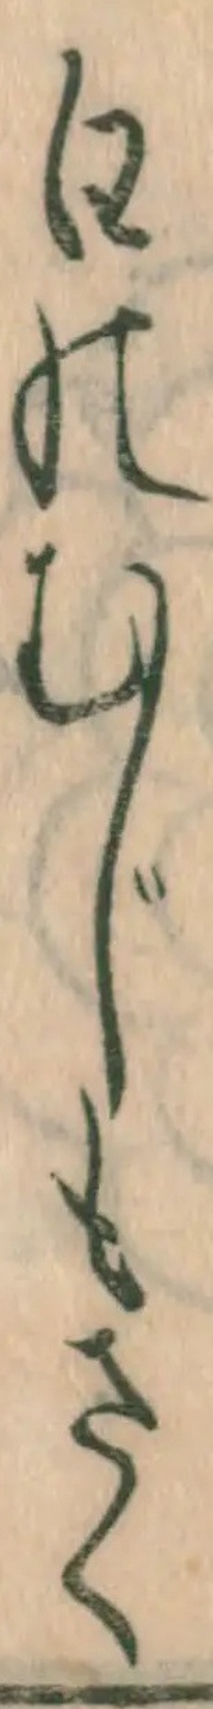白のむじもさく
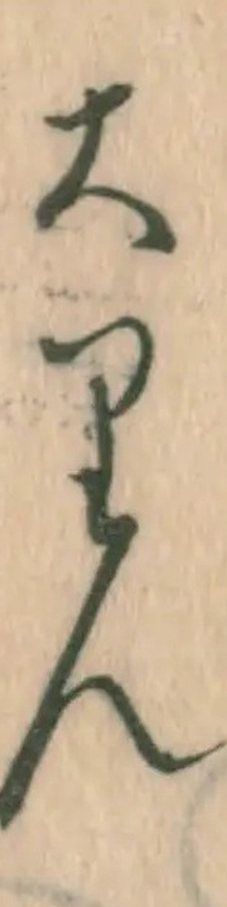大りん
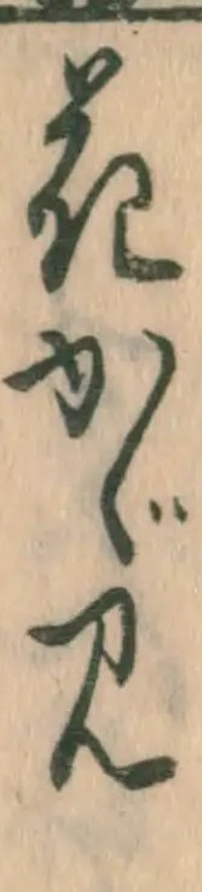花かゞみ
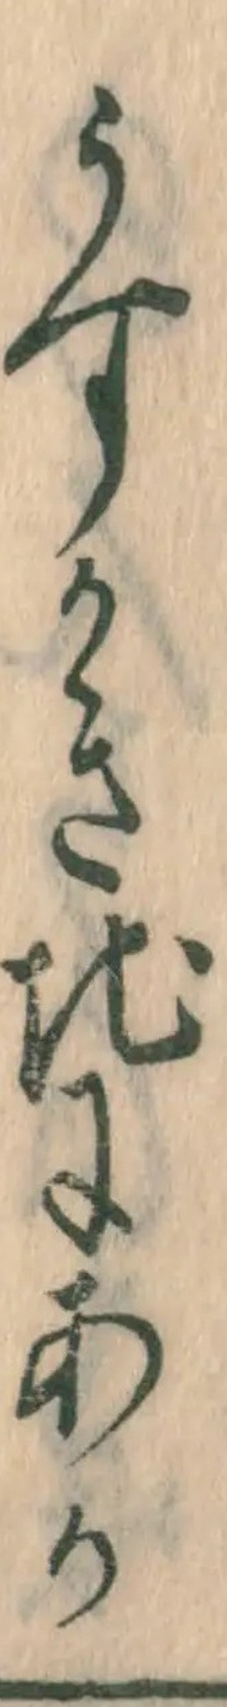うすかき地にあか
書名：錦繍枕 5巻. [4]
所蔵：国立国会図書館 National Diet Library, JAPAN
